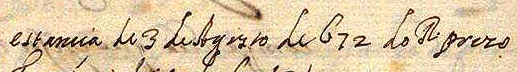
estancia de 3 de Agosto de 672 do R. prezo
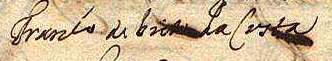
Franco de brito da Costa
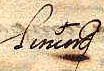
Lencast̄
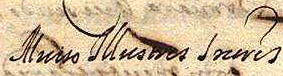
Muito Illustres Snorēs
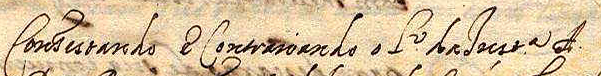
ConTestando e Contrariando o L.o da Iust.a A.
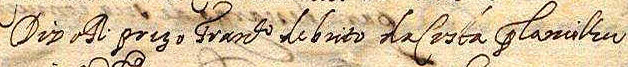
Diz o R. prezo Franco de brito da Costa p̄la milhor
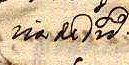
ria de dirto.
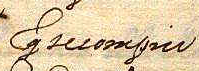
q̄ se comprir
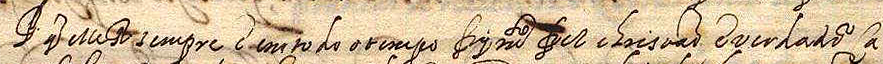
P q̄ elle R sempre, e em todo o tempo foy mto fiel christaõ e verdadro Ca
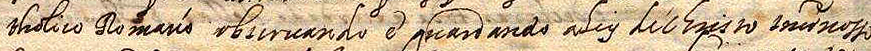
tholico Romano obseruando e guardando a ley de christo snor̄ nosso
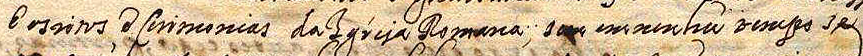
e os ritos e Cerimonias da Igreja Romana; sem em nenhū tempo se
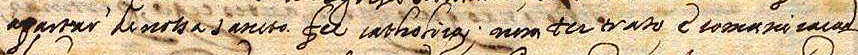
apartar de nossa sancta fee catholica; nem ter trato, e comunicaçaõ
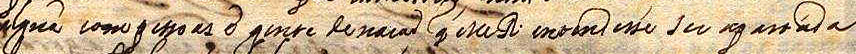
alguā com pessoas, e gente de naçaõ q̄ elle R. entendesse ser apartada
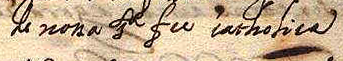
de nossa sta fee catholica
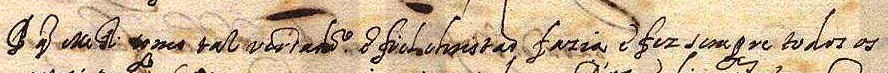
P q̄ elle R. como tal verdadro. e fiel christaõ, fazia e fez sempre todos os
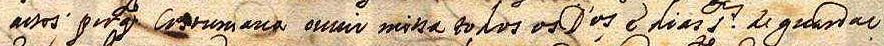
actos; porqto costumaua ouuir missa todos os Dos, e dias stos. de guardar
